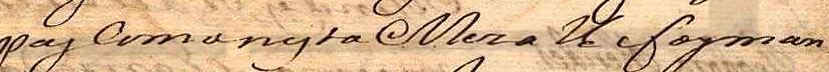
pas Como nesta Meza lhe foy man
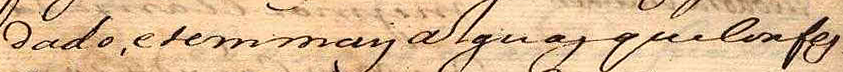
dado, e tem mais alguas que Confes
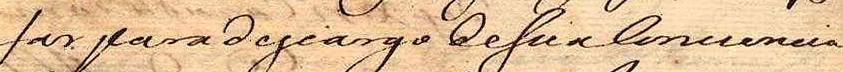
sar para descargo de sua Conciencia
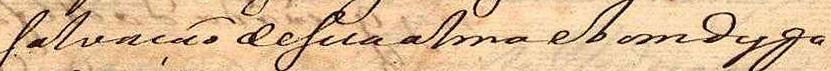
salvaçaõ de sua alma e bom despa
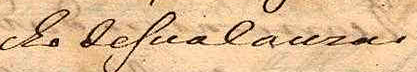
cho de sua Cauza.
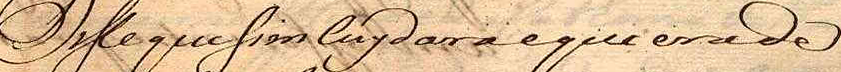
Disse que sim Cuydara e que era de
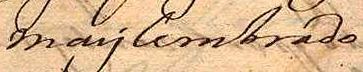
mais lembrado
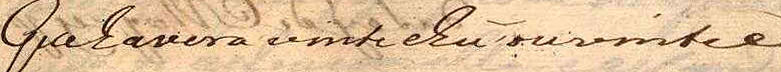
Que havera vinte e hū ou vinte e
